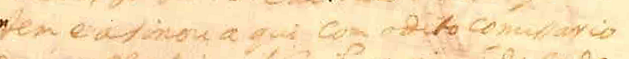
tem e asinou aqui com o dito comissario
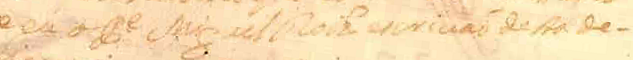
e eu o P.e Miguel Roiz̄ escriuāo desta de
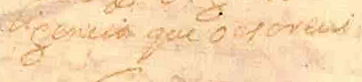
ligencia que o escreui
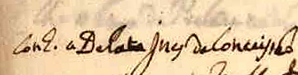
Conh. a Delata Jnes da Conceissão
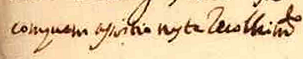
com quem assistio neste Recolhimto
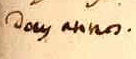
dous annos.
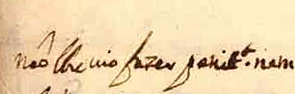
naõ lhe uio fazer penit.a nem
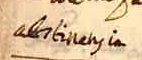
abstinensia
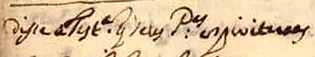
disse a Test.a q̄ seus P.es espirituaes
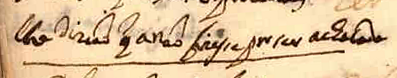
lhe diziaõ q̄ a naõ fizesse por ser achacada
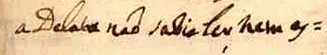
a Delata naõ sabia ler, nem es
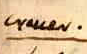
creuer.
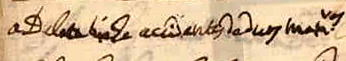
a Delata tinha accidentes de duas man.ras
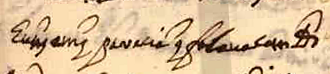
huns em q̄ parecia q̄ falaua com Ds̄
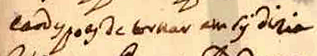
e ao despoes de tornar em sy dizia
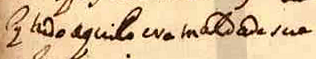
q̄ tudo aquilo era maldade sua
